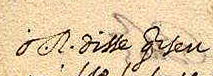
o R. disse q̄ seu
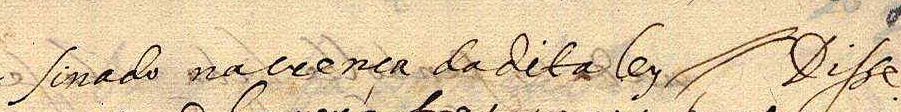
sinado na crença da dita ley // Disse
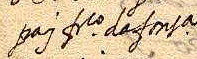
paj frc.o da fonsa.
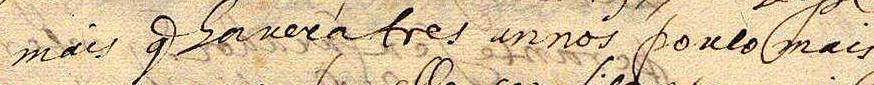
mais q̄ hauerá tres annos pouco mais
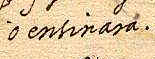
o ensinara.
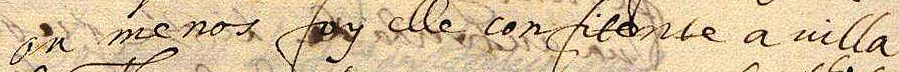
ou menos foy elle confitente a uilla
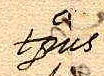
tp̄us
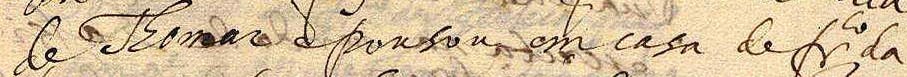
de Thomar, e pousou em casa de frco da
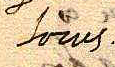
locus.
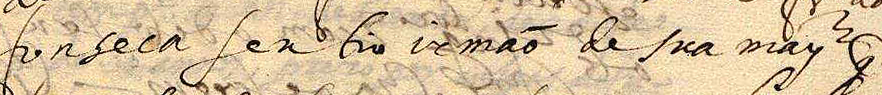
fonseca seu tio irmaõ de sua maȳ q̄
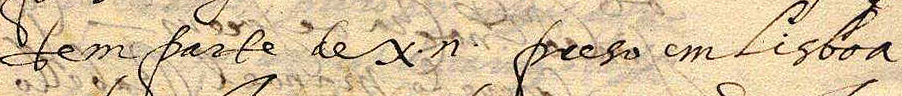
tem parte de x. n. preso em Lisboa
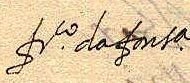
fr.co da fonsa.
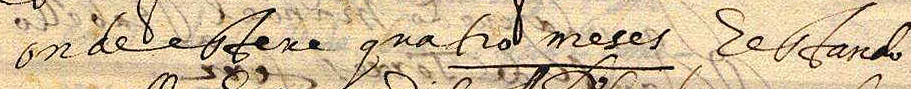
onde esteue quatro meses E estando
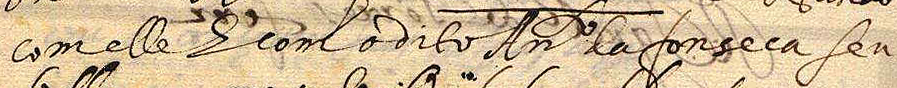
com elle E com o dito Anto da fonseca seu
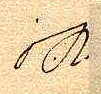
o R.
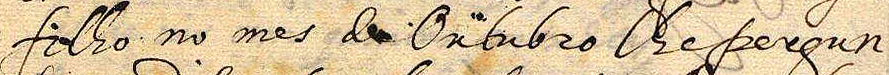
filho no mes de Outubro lhe pergun
